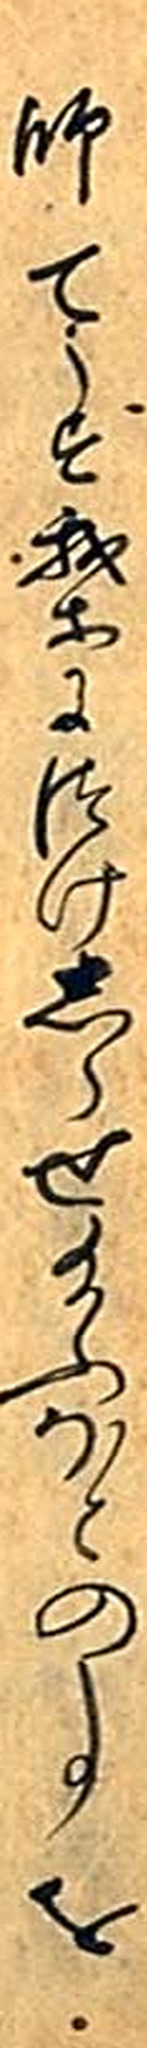師てうす我等につけしらせ給ふほとの事を
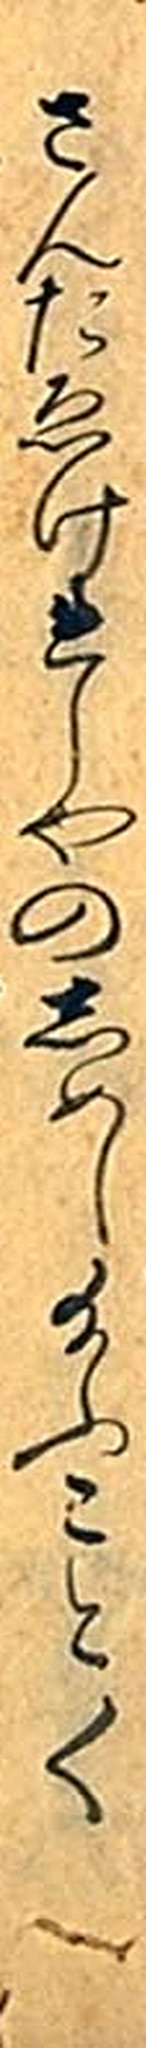さんたゑけれしやのしめし給ふことく
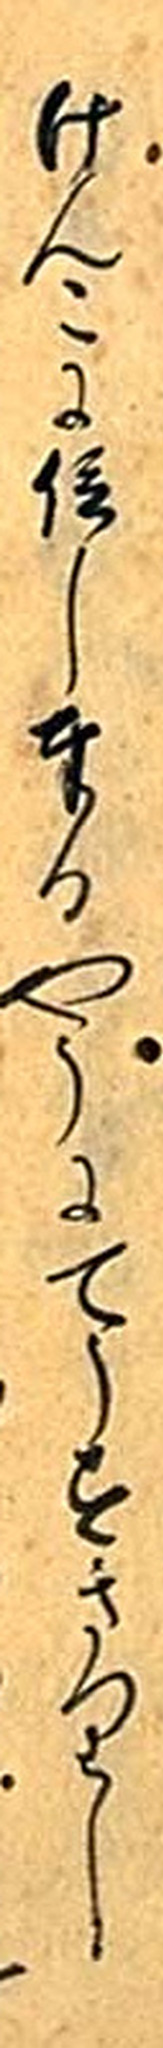けんこに信し奉るやうにてうすきりし
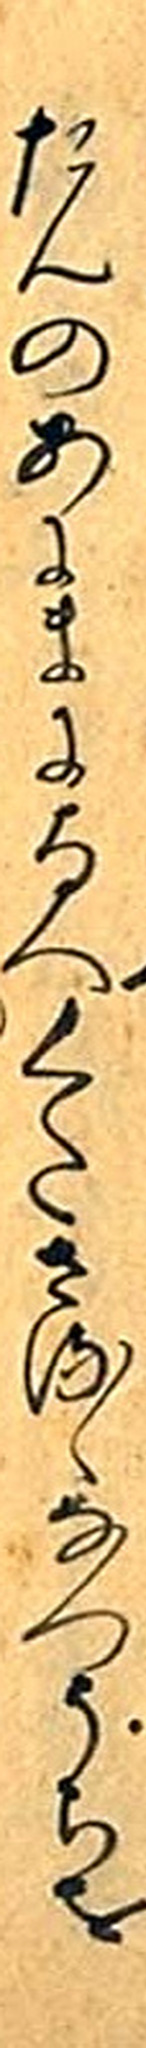たんのあにまに与へくたさるゝなつうらを
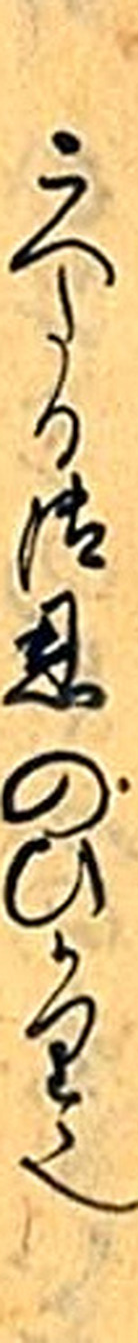こへたる御恩のひかり也
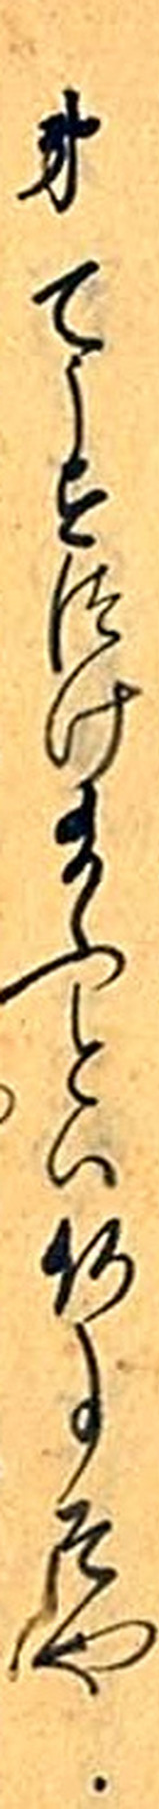弟てうすつけ給ふとは何事そや
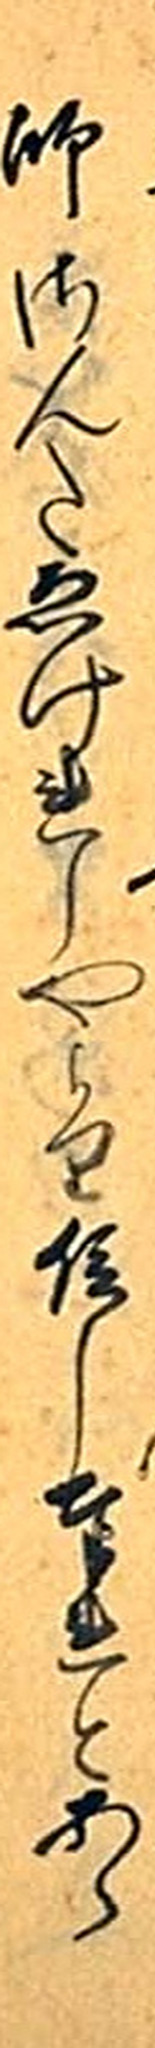師さんたゑけれしやより信し奉れとあら
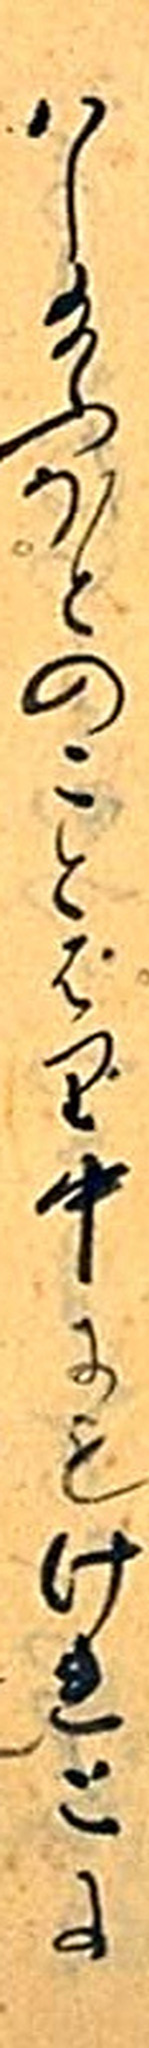はし給ふほとのことはり中にもけれとに
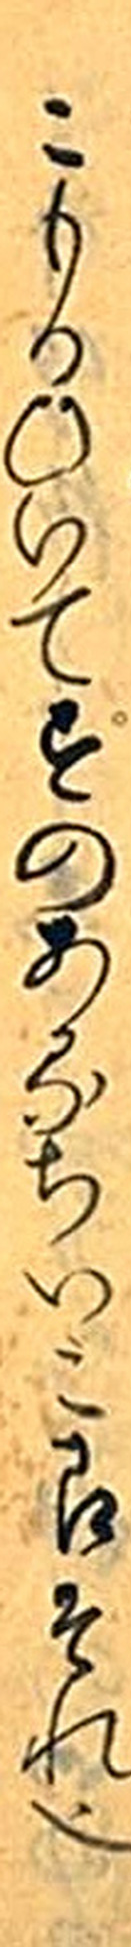こもるひいてすのあるちいこ即それ也
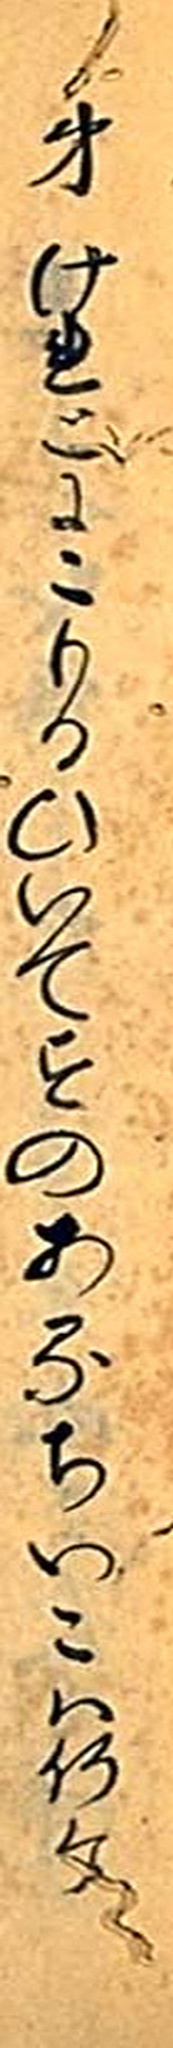弟けれとにこもるひいてすのあるちいこは何ケ
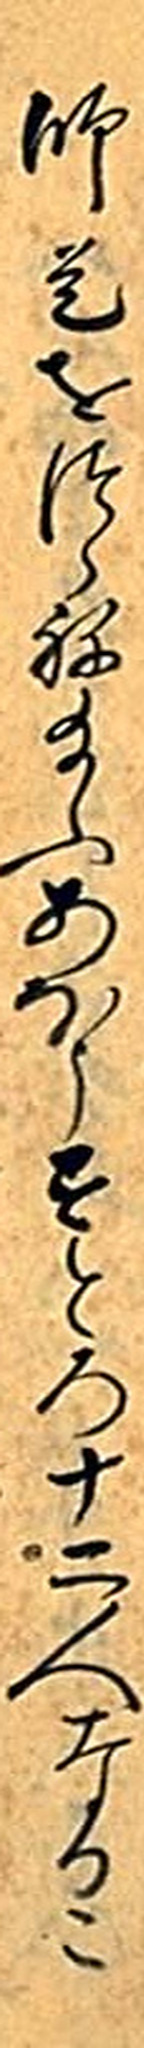師是をつらね給ふあほうすとろ十二人なるこ
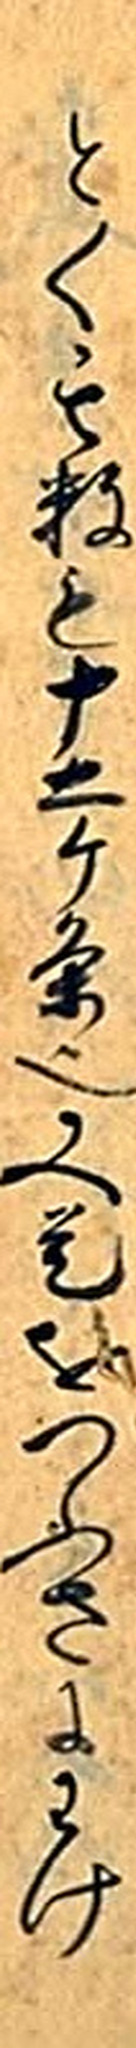とく其数も十二ケ条也又是をつふさにわけ
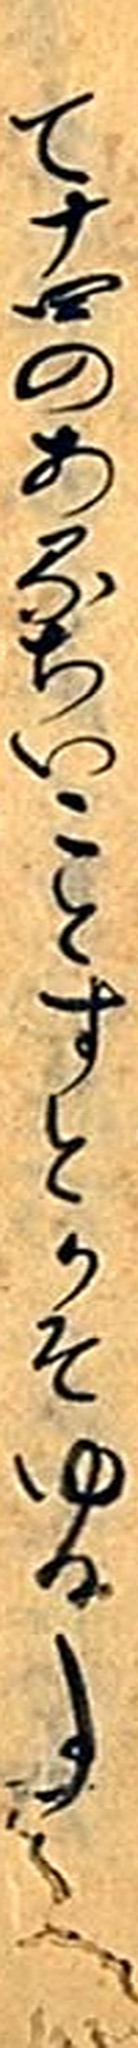て十四のあるちいことすとかそゆる事
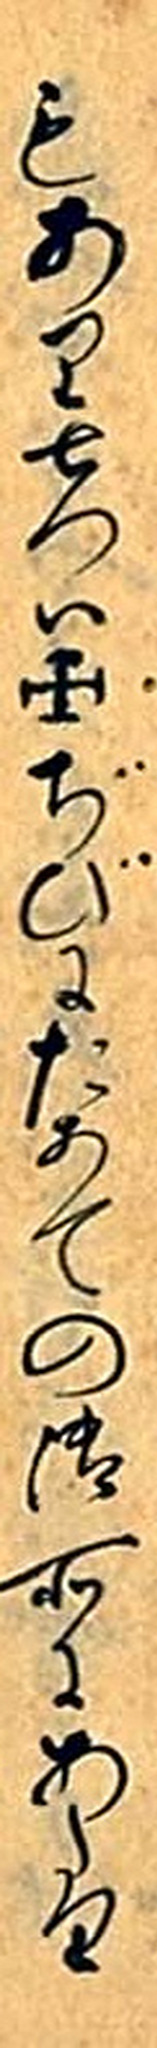もあり七つは☩ぢびにたあての御所にあたり
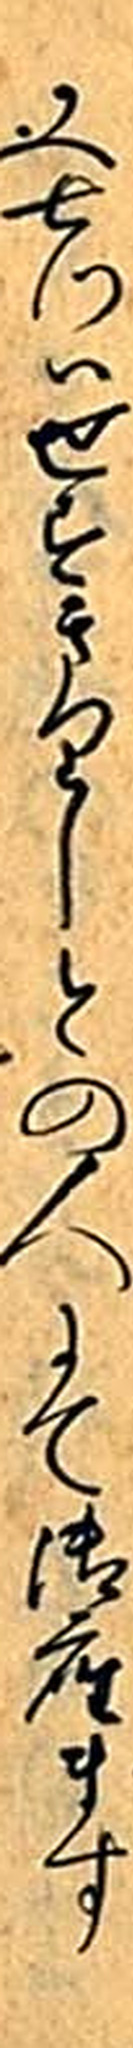又七つはせすきりしとの人にて御座ます
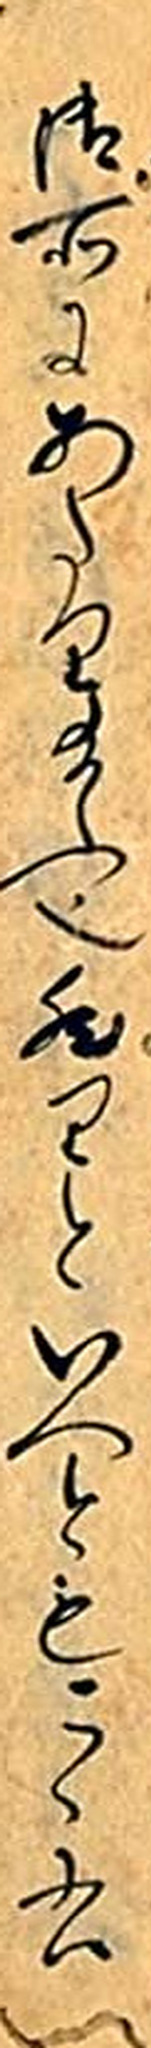御所にあたり給ふ也然りといへともこゝには
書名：ドチリナ・キリシタン
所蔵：東京大学総合図書館 / General Library in the University of Tokyo
